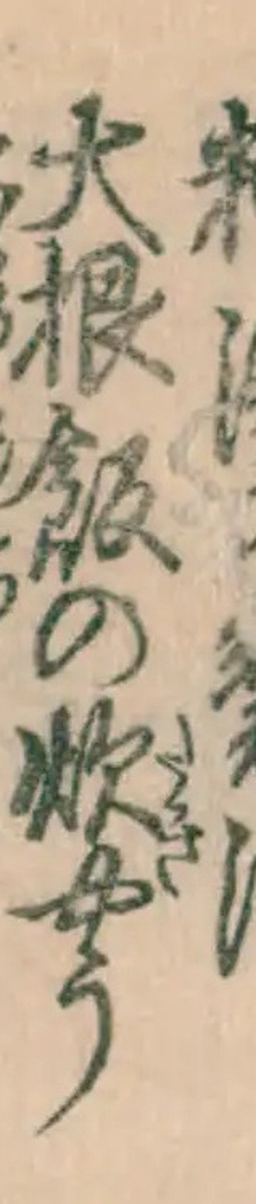大根飯の炊やう
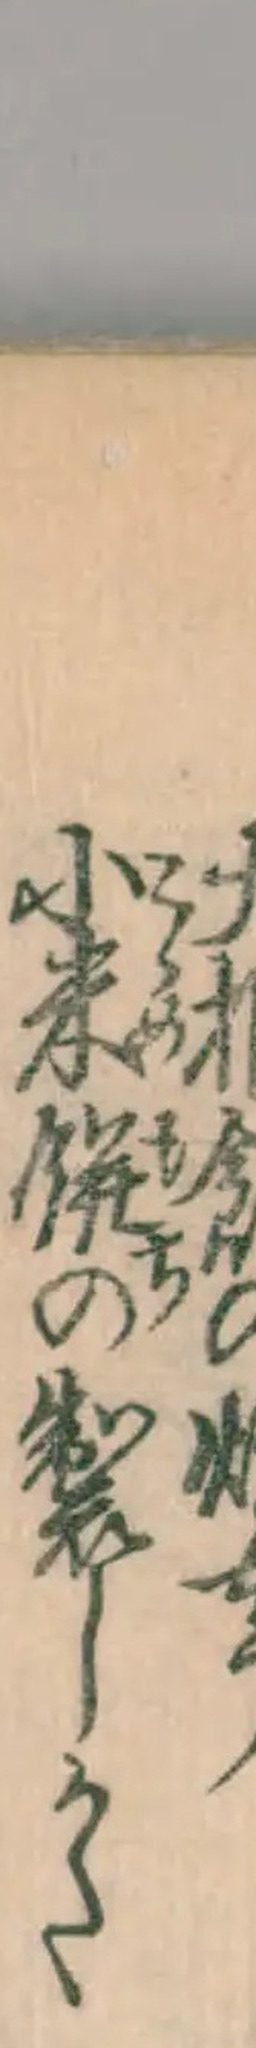小米餅の製しかた
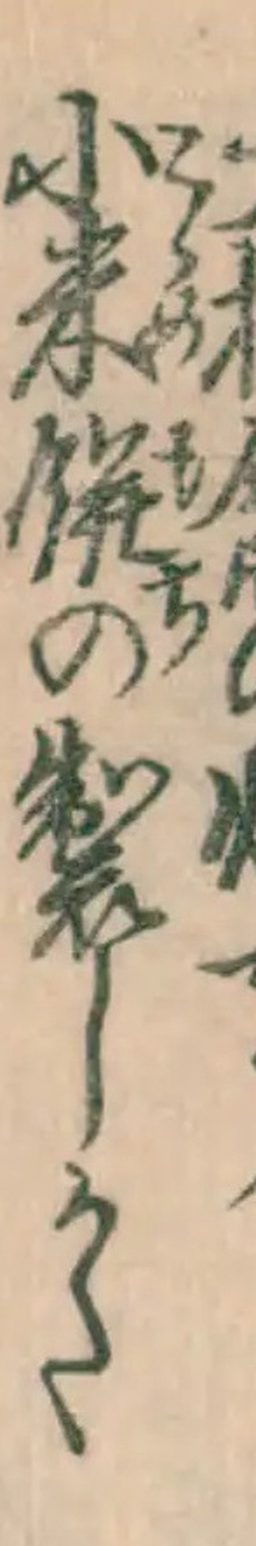小米餅の製しかた
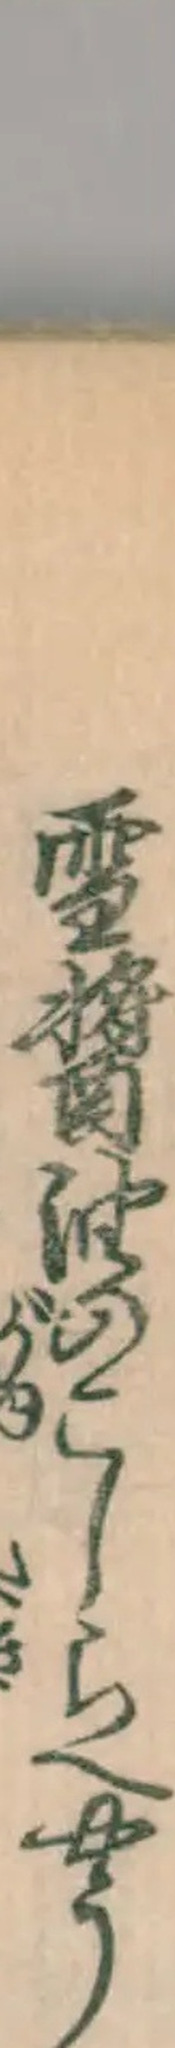雪醤油のこしらへやう
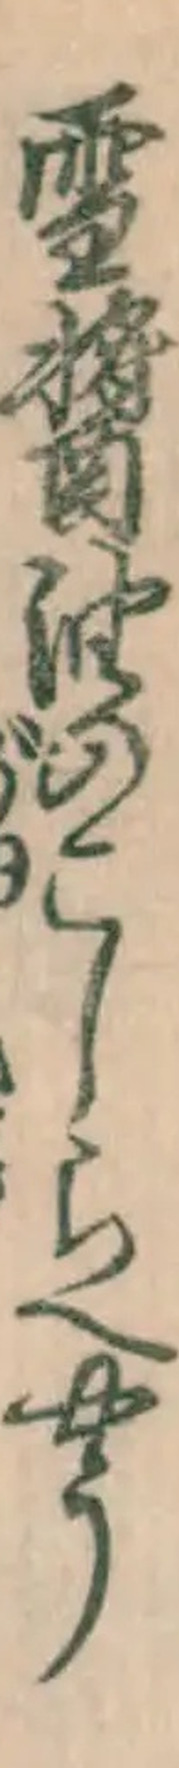雪醤油のこしらへやう
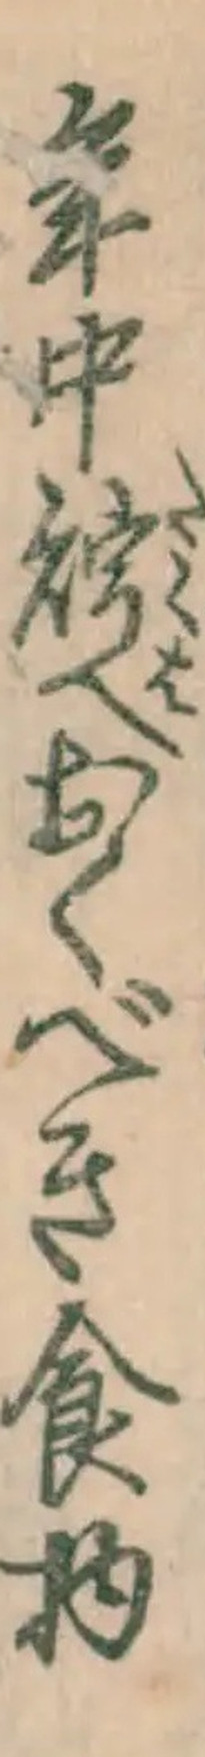年中貯へおくべき食物

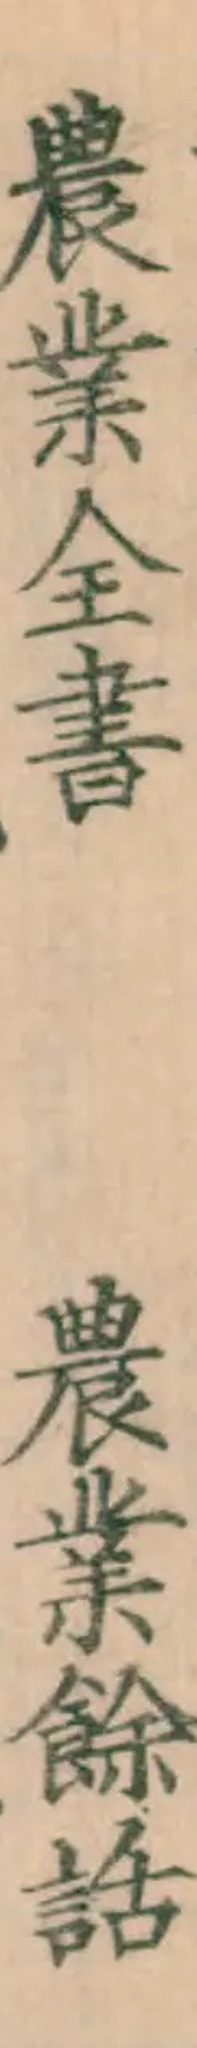農業全書農業余話
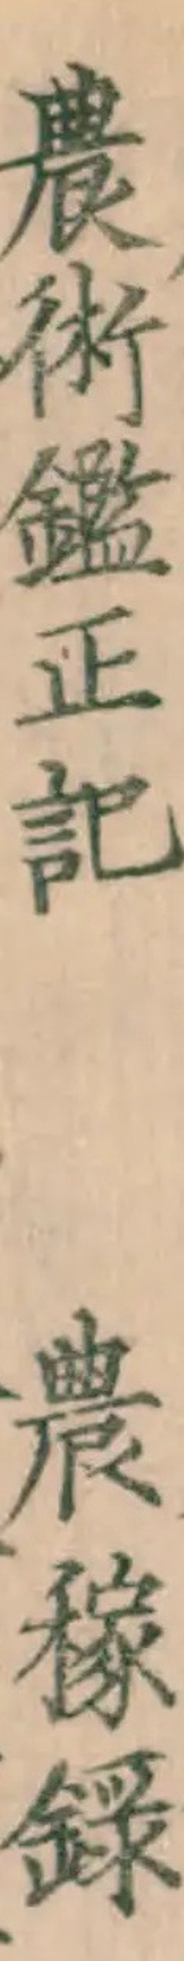農術鑑正記農稼録
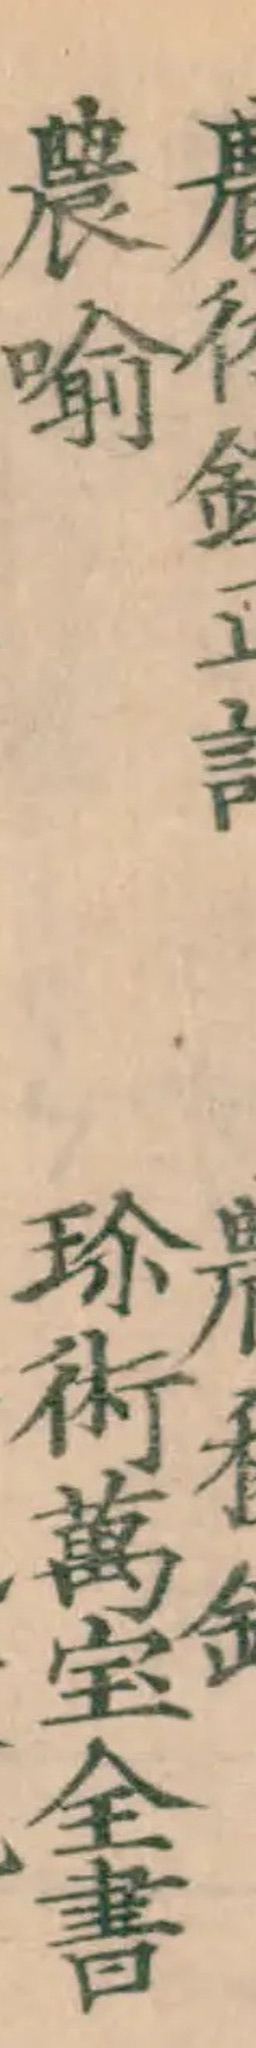農喩珍術万宝全書
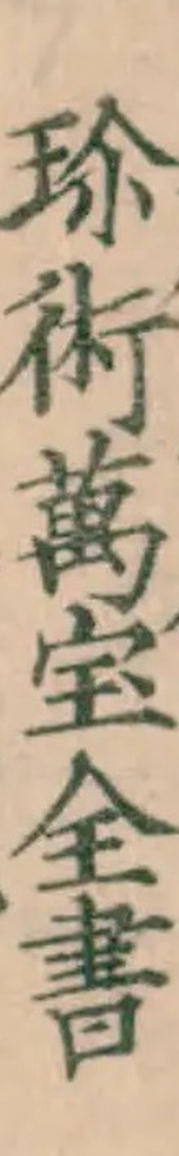農喩珍術万宝全書
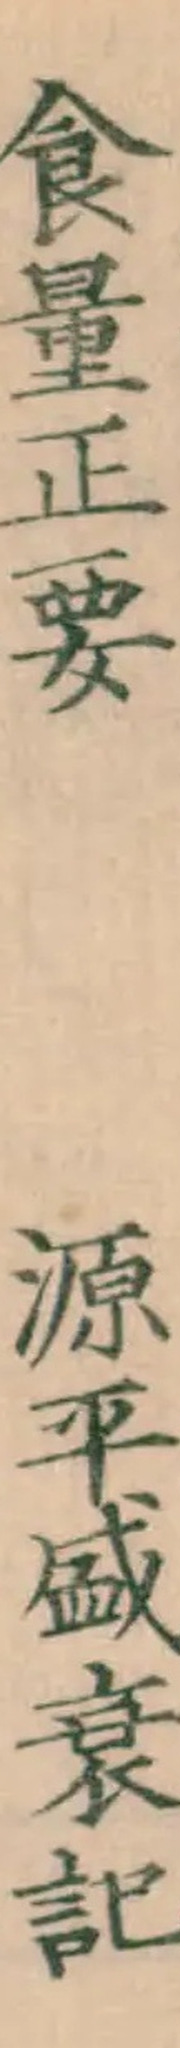食量正要源平盛衰記
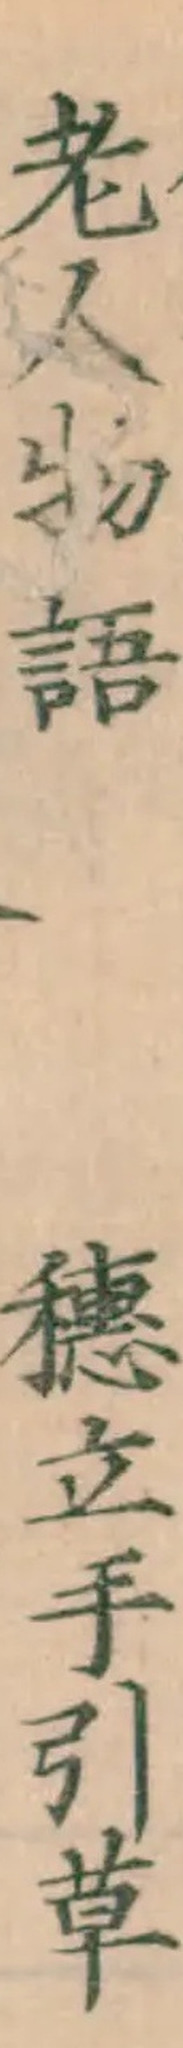老人物語穂立手引草
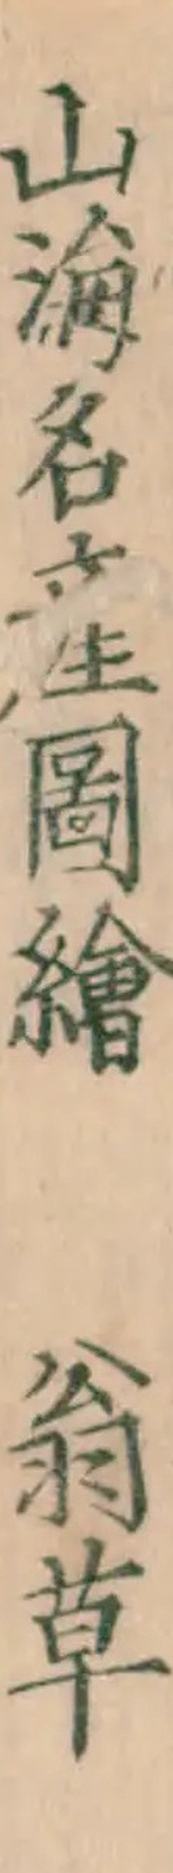山海名産図絵翁草
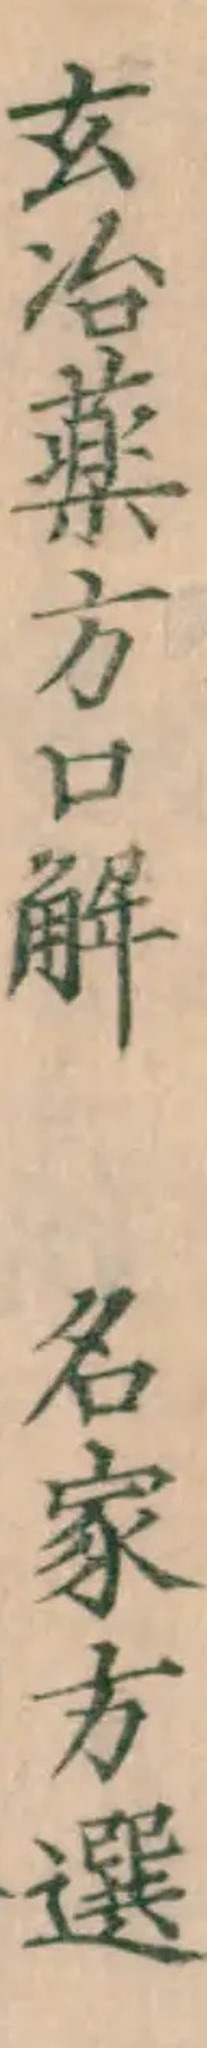玄治薬方口解名家方選
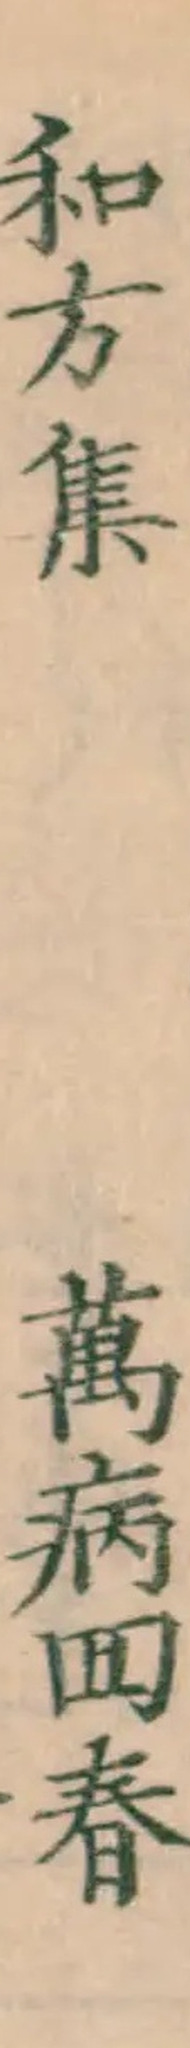和方集万病回春
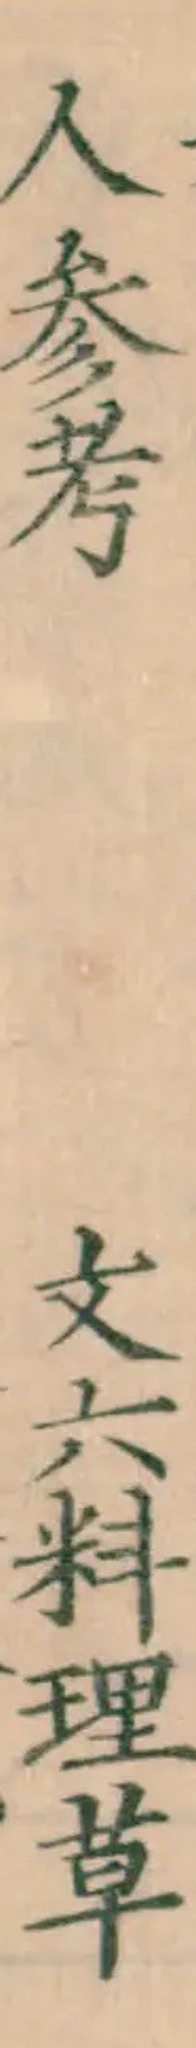人参考文六料理草
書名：日ごとの心得
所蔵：国立国会図書館 National Diet Library, JAPAN
